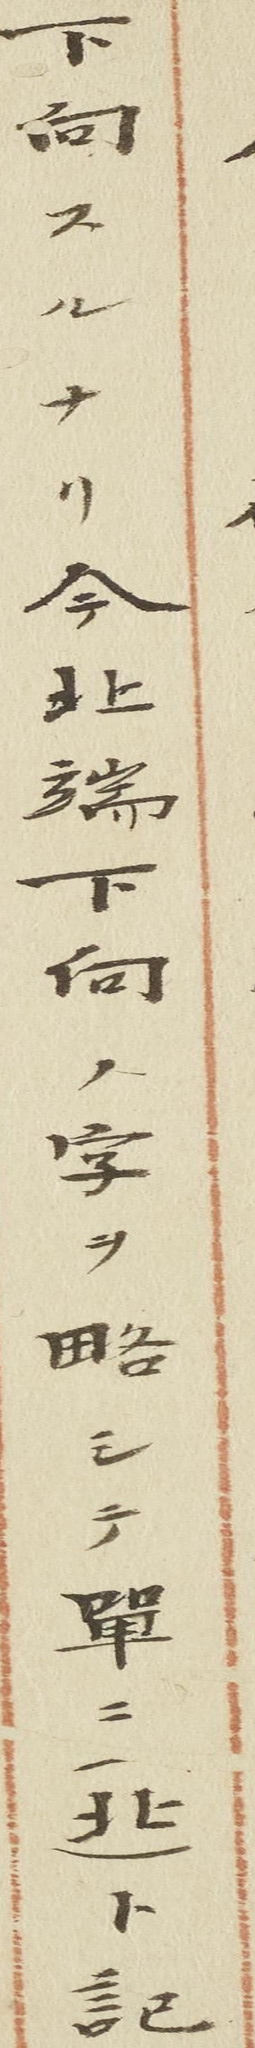下向スルナリ今北端下向ノ字ヲ略シテ単ニト記
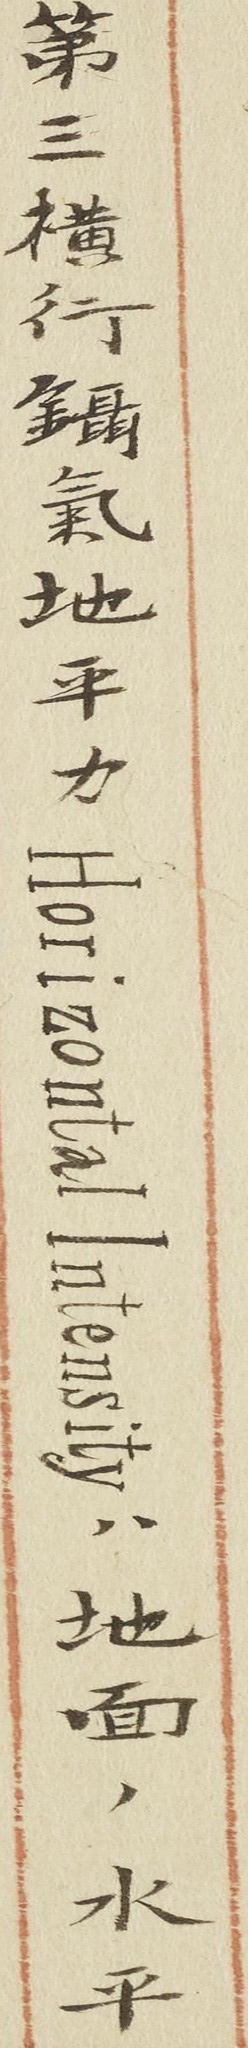第三横行鑷気地平力ハ地面ノ水平
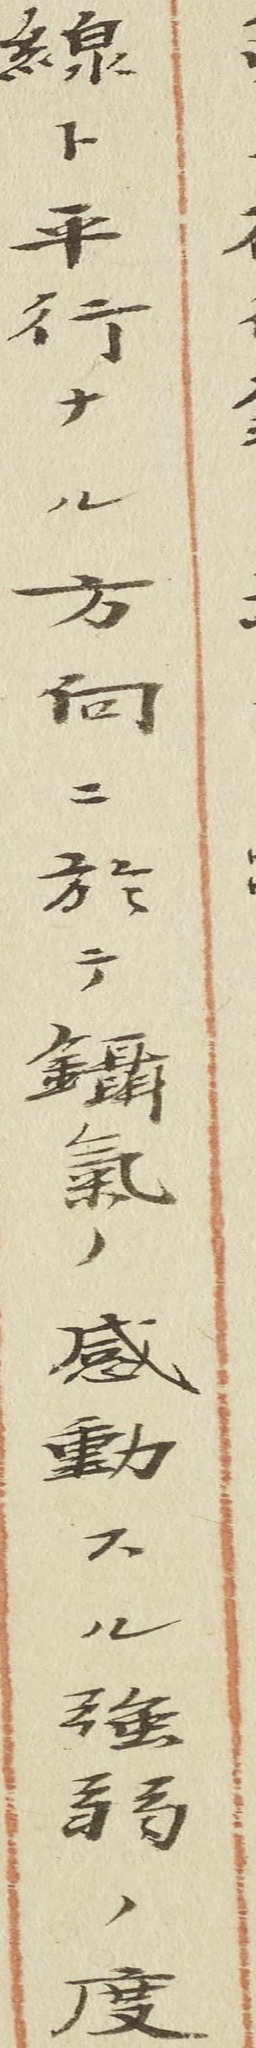線ト平行ナル方向ニ於テ鑷気ノ感動スル強弱ノ度
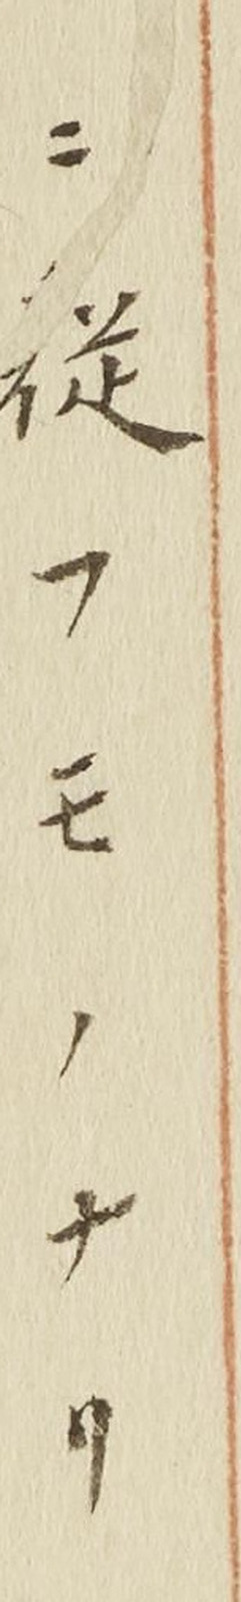ニ従フモノナリ
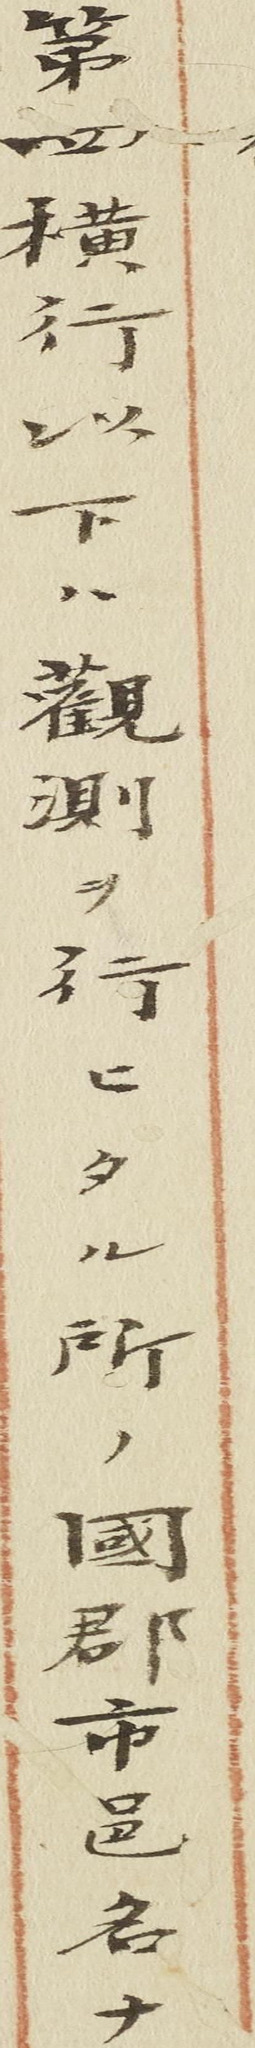第四横行以下ハ観測ヲ行ヒタル所ノ国郡市邑名ナ
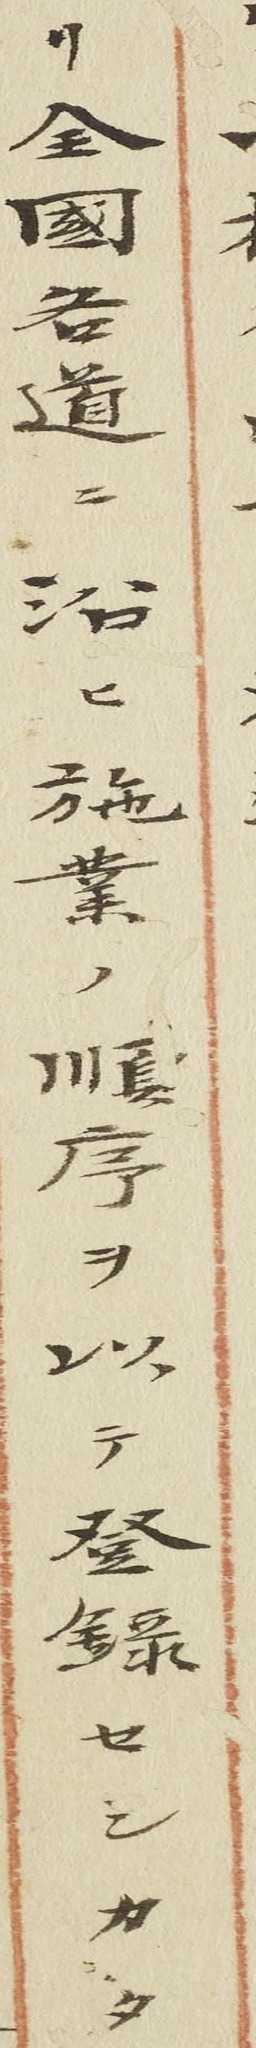リ全国各道ニ沿ヒ施業ノ順序ヲ以テ登録セシカタ
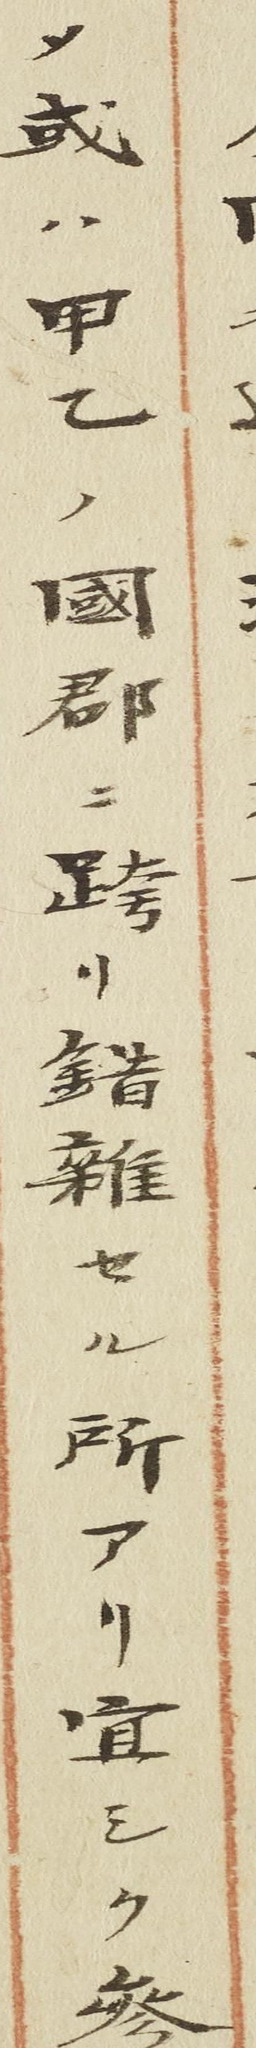メ或ハ甲乙ノ国郡ニ跨リ錯雑セル所アリ宜シク参
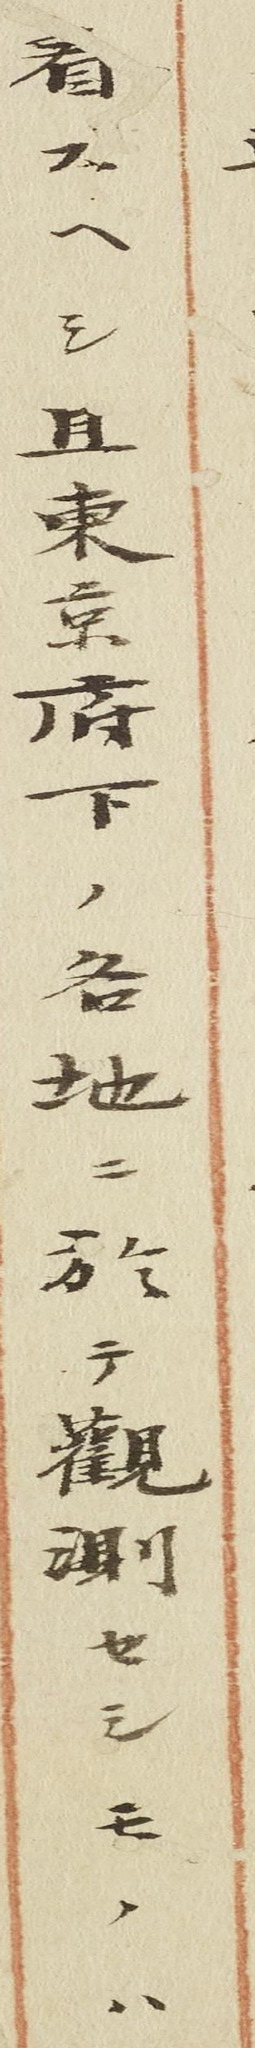看スヘシ且東京府下ノ各地ニ於テ観測セシモノハ
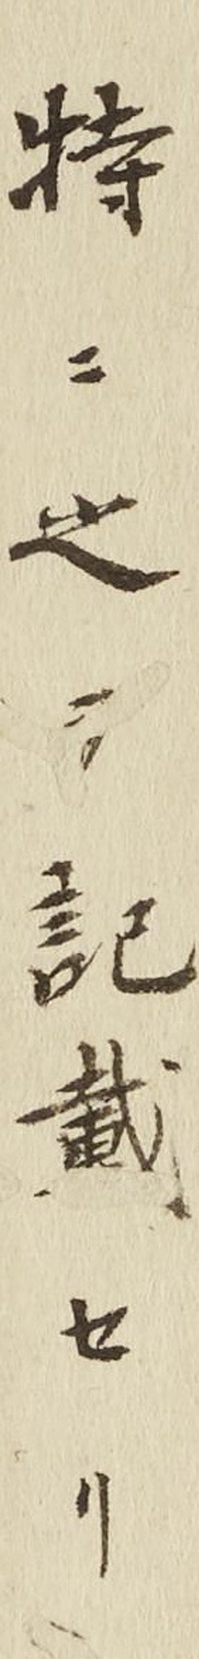特ニ之ヲ記載セリ
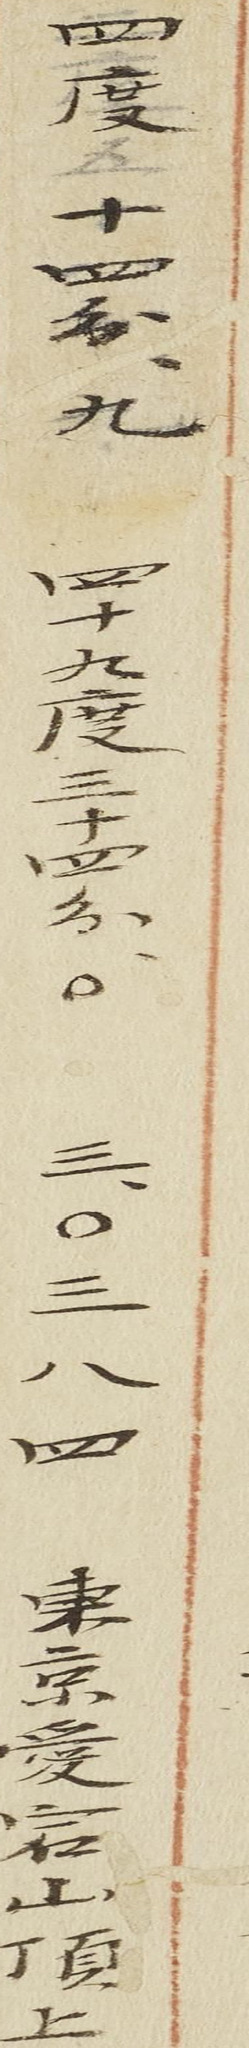四度十四分、九四十九度三十四分、〇三、〇三八四東京愛宕山頂上
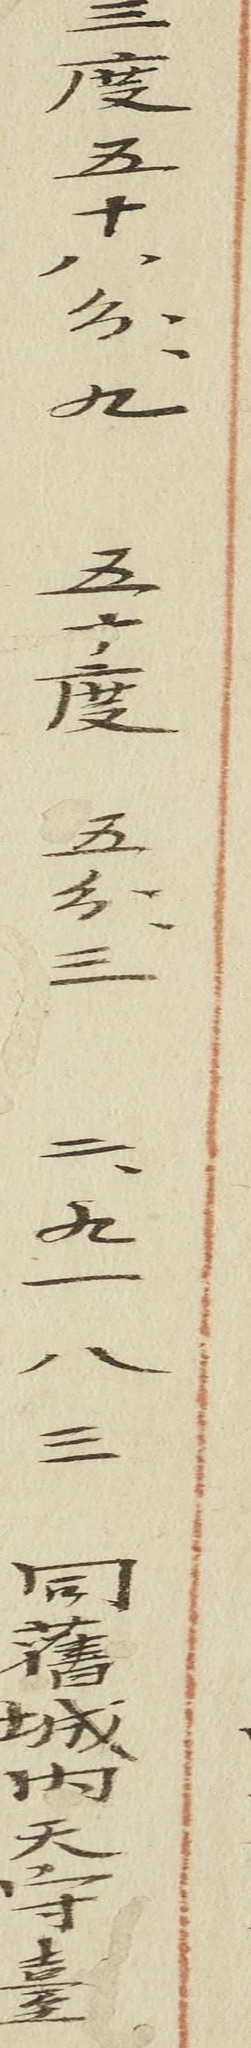三度五十八分、九五十度五分、三二、九一八三同藩城内天守台
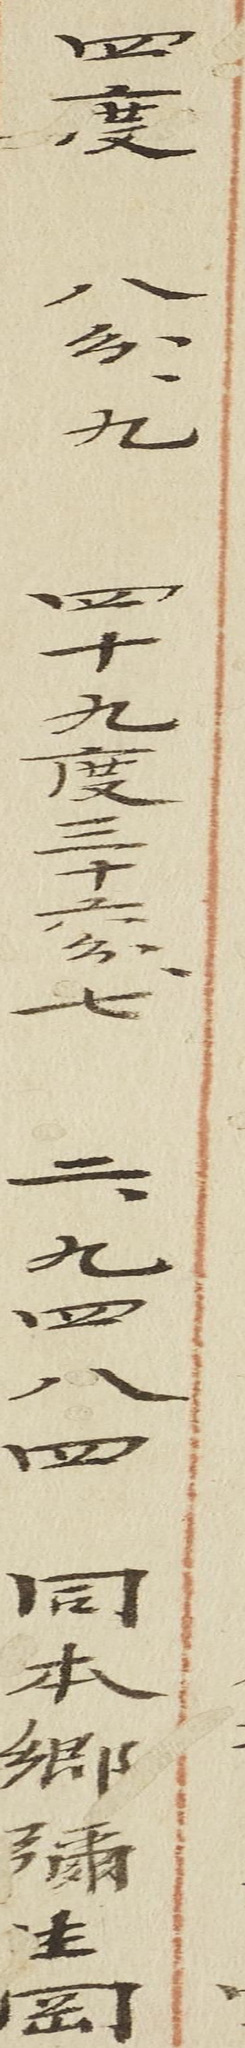四度八分、九四十九度三十六分、七二、九四八四同本郷弥生岡
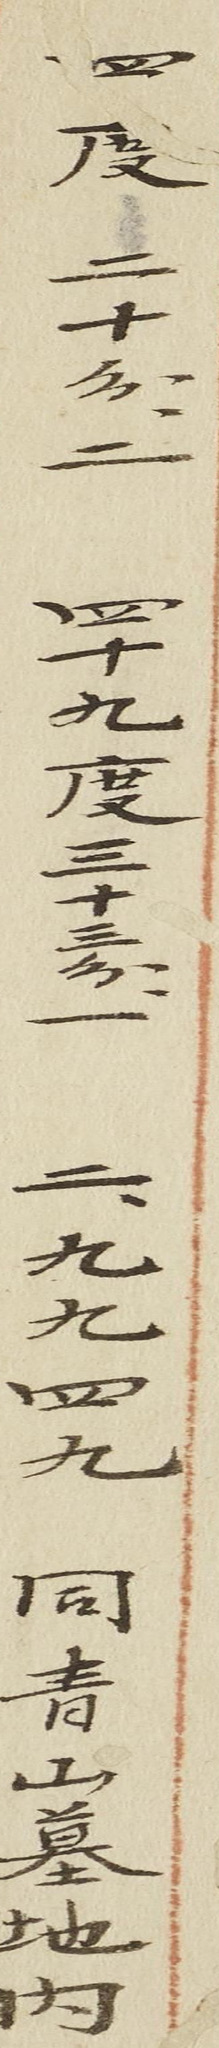四度二十分、二四十九度三十三分、一二、九九四九同青山墓地内
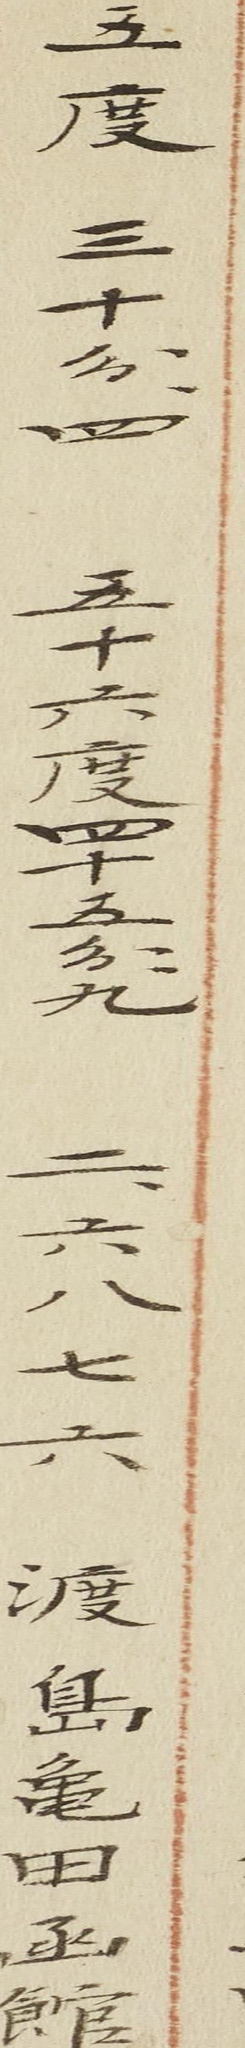五度三十分、四五十六度四十五分、九二、六八七六渡島亀田函館
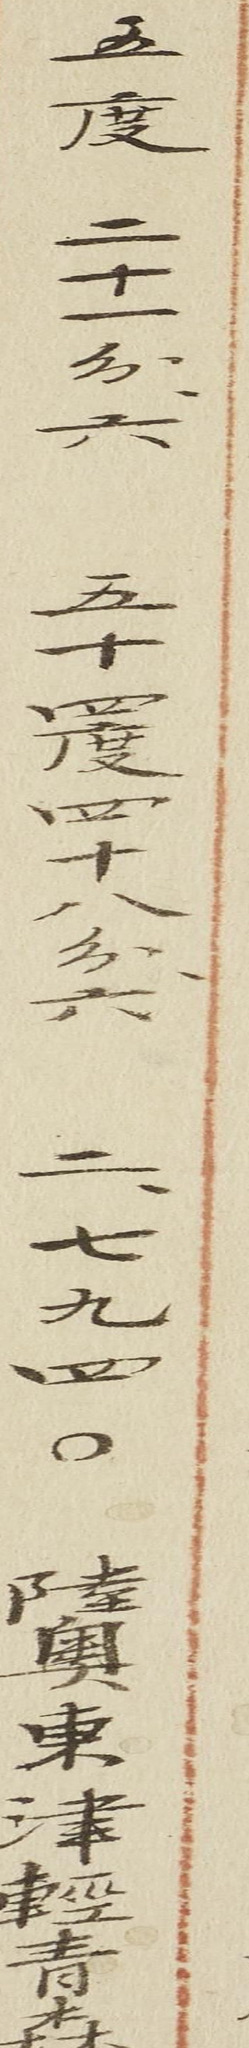五度二十一分、六五十四度四十八分、六二、七九四〇陸奥東津軽青森
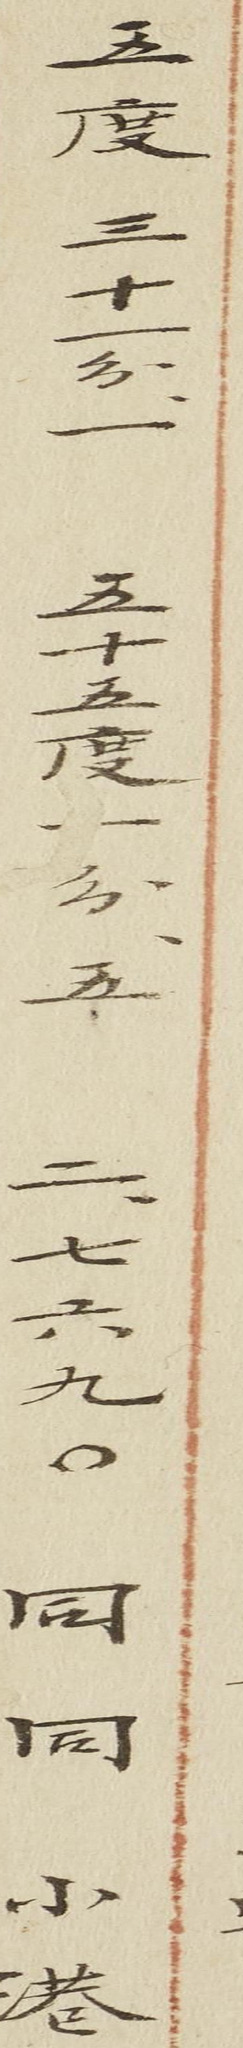五度三十一分、一五十五度一分、五二、七六九〇同同小港
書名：鑷力観測報告
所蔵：東京大学地震研究所図書室 Earthquake Research Institute Library, The University of Tokyo, JAPAN
